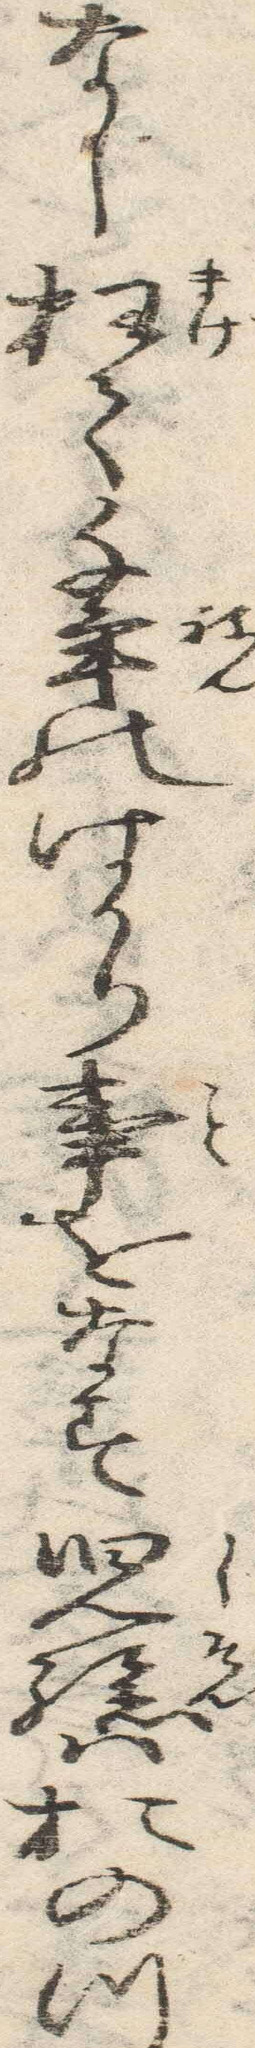なし枉て千年のはかり事をなす児孫はおのつ
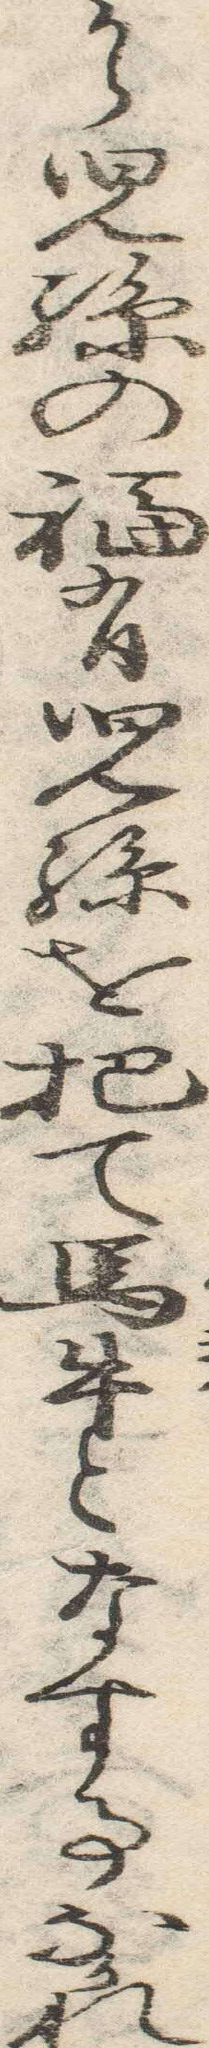から児孫の福有児孫を把て馬牛となす事なかれ
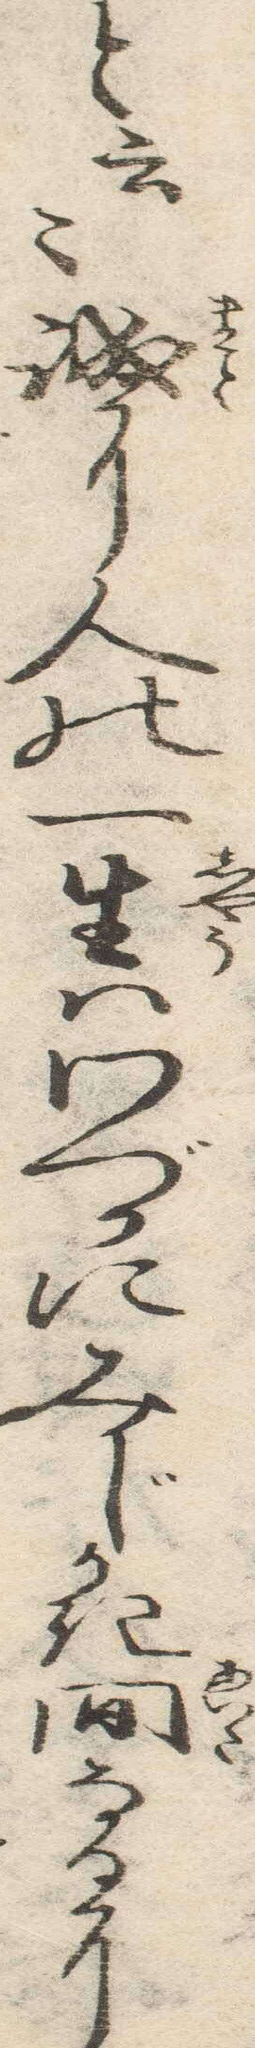と云々誠に人の一生はわづかにみじかき間なるに
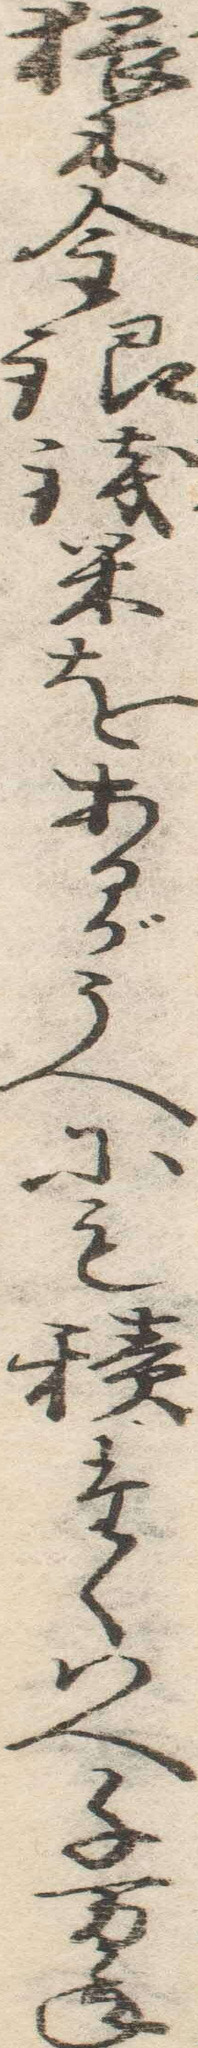猥に金銀銭米をあるがうへにも積たくはへ千万年
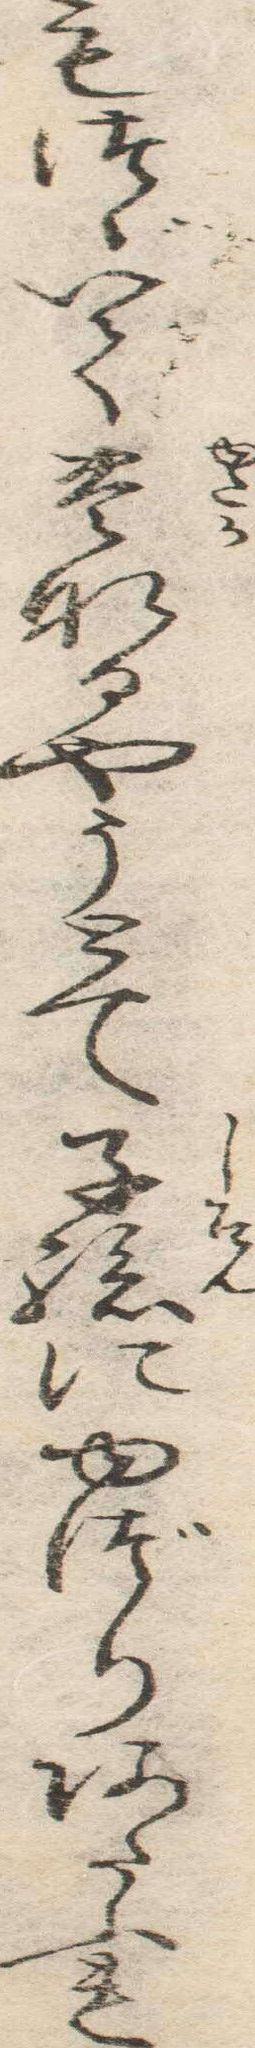もつゞいて豊なるやうとて子孫にゆづりあたふれ
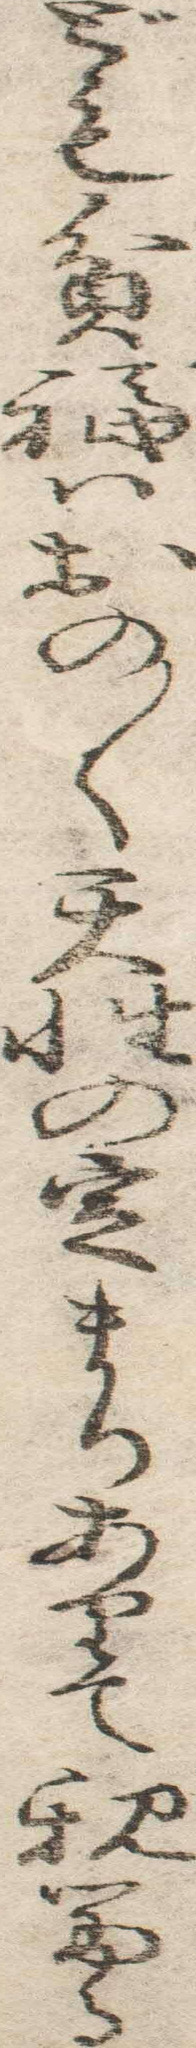ども貧福はおの〳〵天性の定まりありて親富る
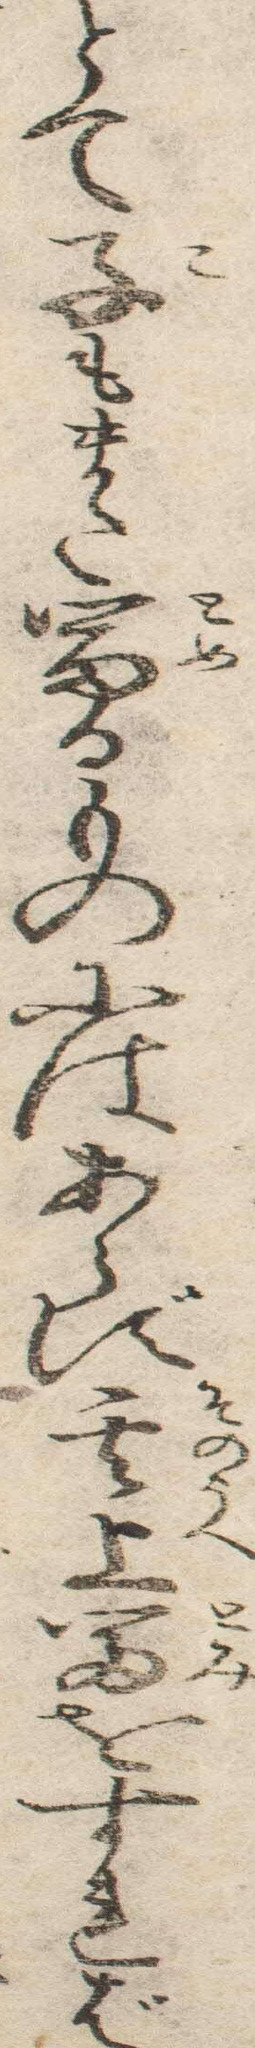とて子もまた富るものにはあらず其上富をすれば
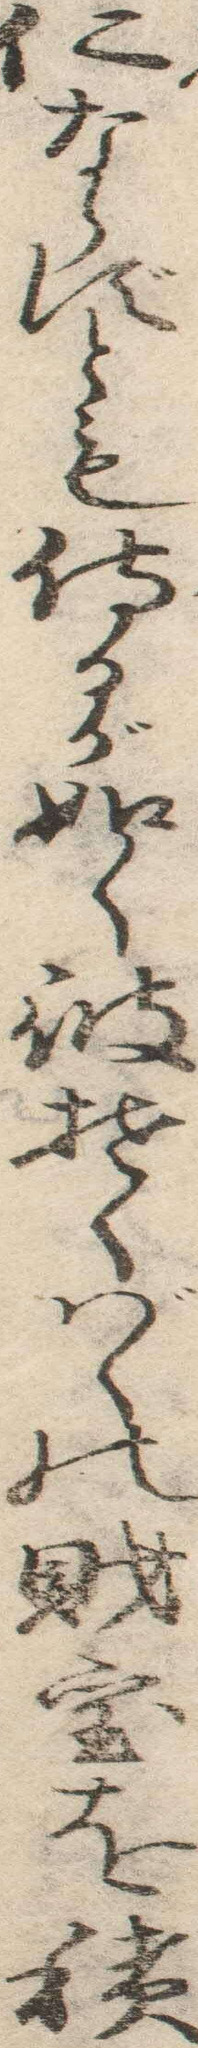仁ならずとも侍るが如く彼そくばくの財宝を積

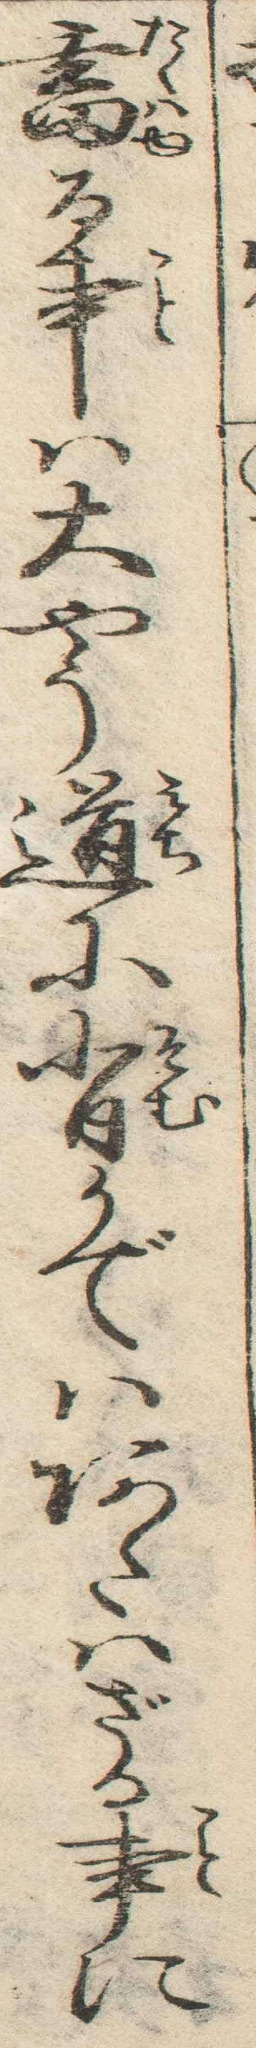蓄る事は大やう道に背かではあたはざる事に
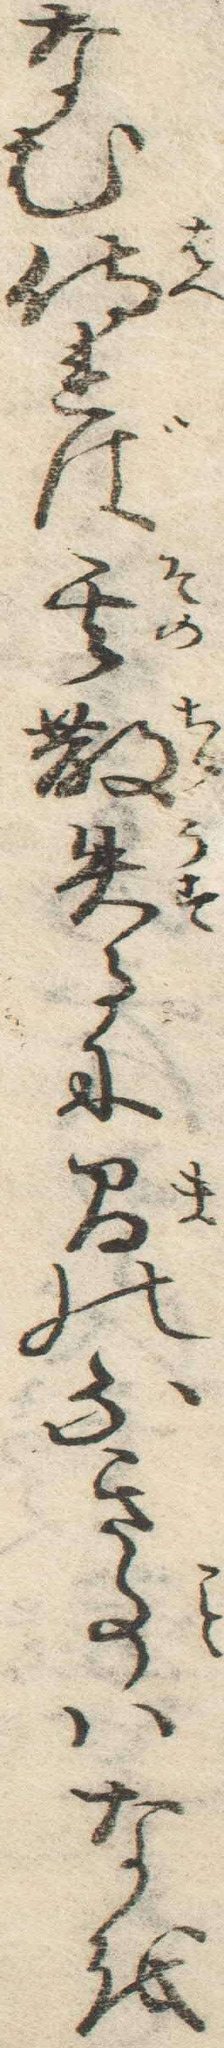なむ侍れば其散失るに間のなき事はなを
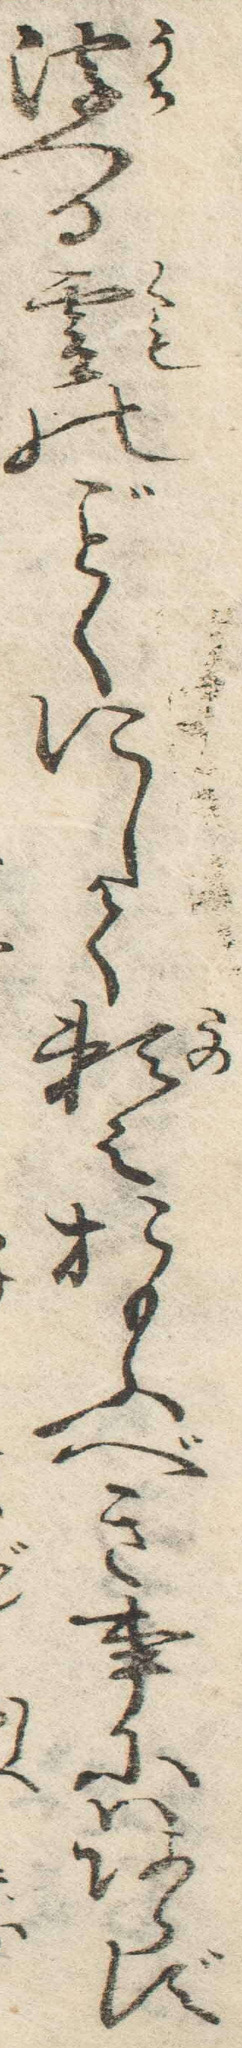浮へる雲のごとくにして頼みおもふべき事にはあらず
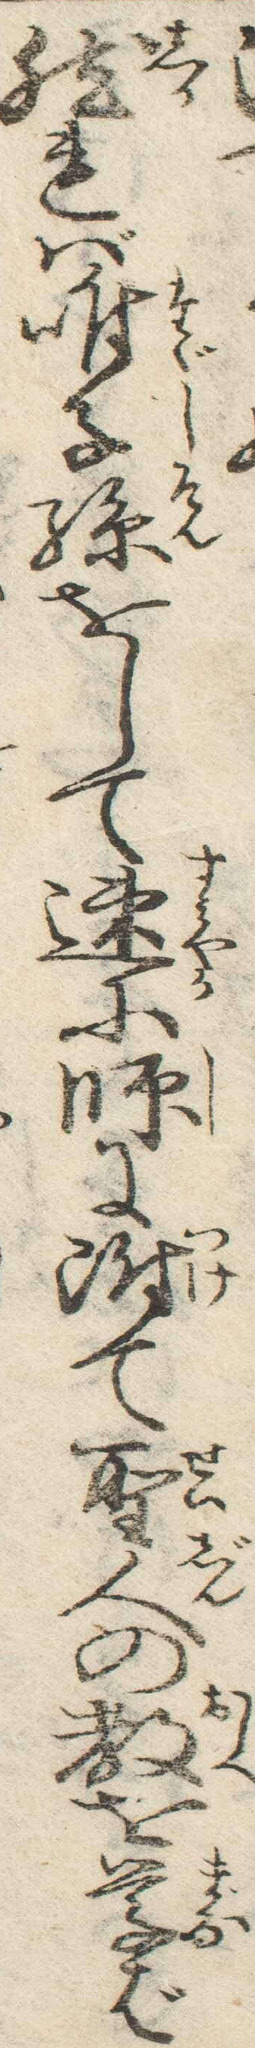然れば唯子孫をして速に師に付て聖人の教を学ば
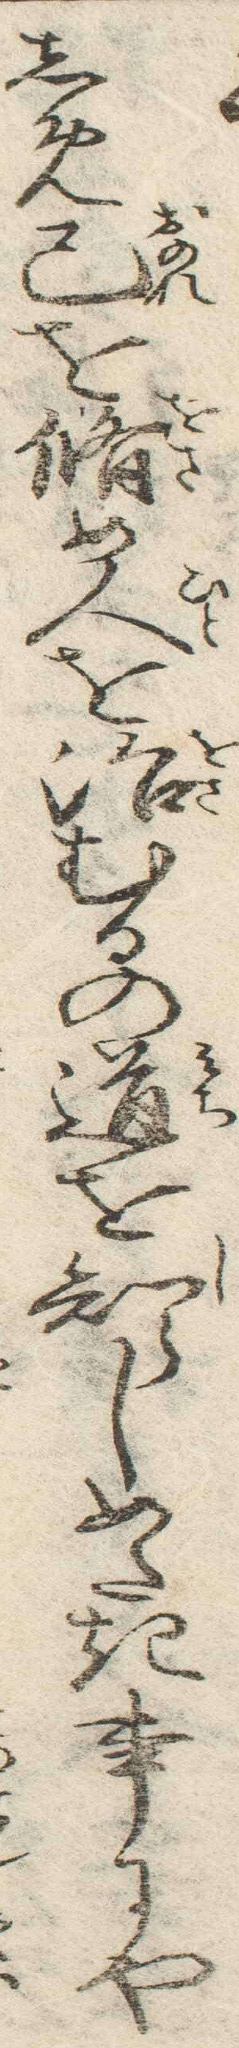しめ己を脩め人を治むるの道を知らしめたき事にや
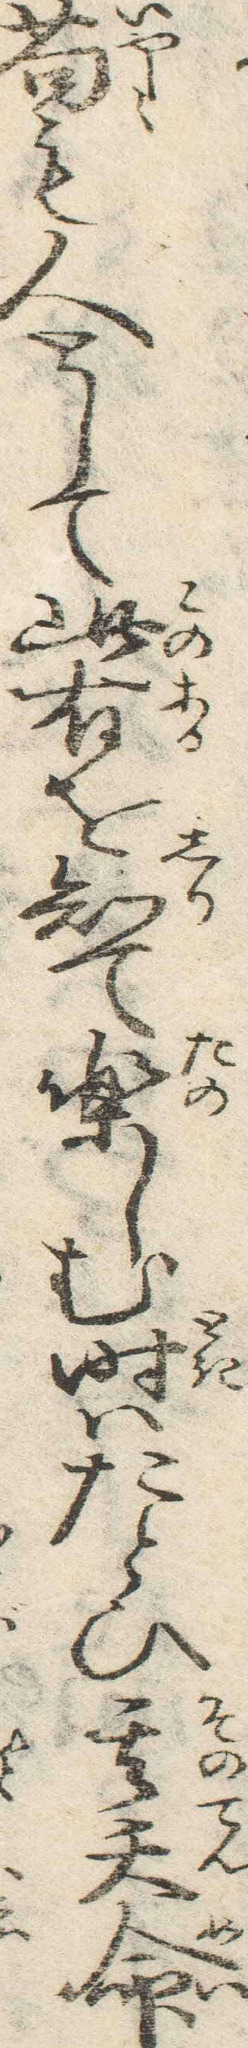苟も人として此有を知て楽しむ時はたとひ其天命
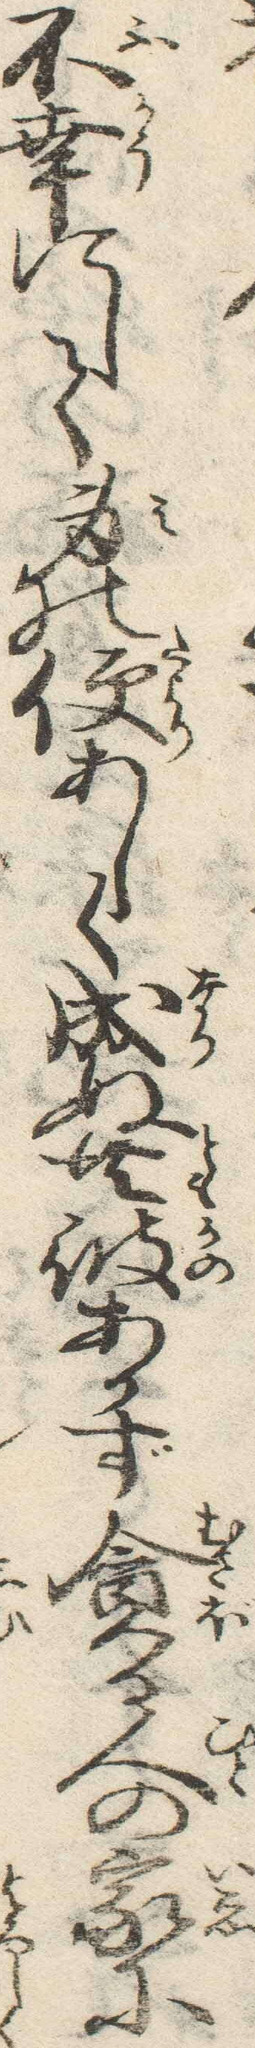不幸にして身の便あしく成ぬ共彼あかず貪る人の家に
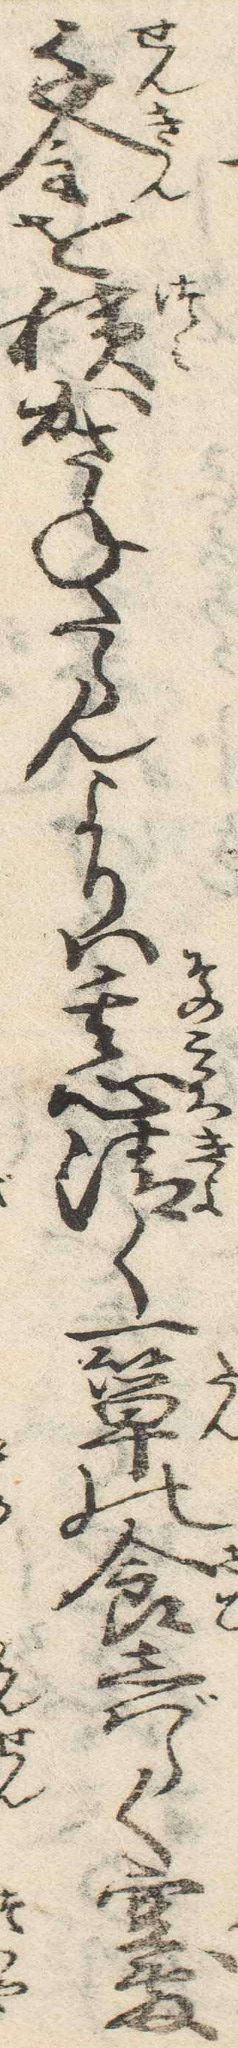千金を積かさねたらんよりは其心清く一簞の食しばらく宜敷
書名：撫育草
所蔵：東京学芸大学附属図書館 国文学研究資料館
